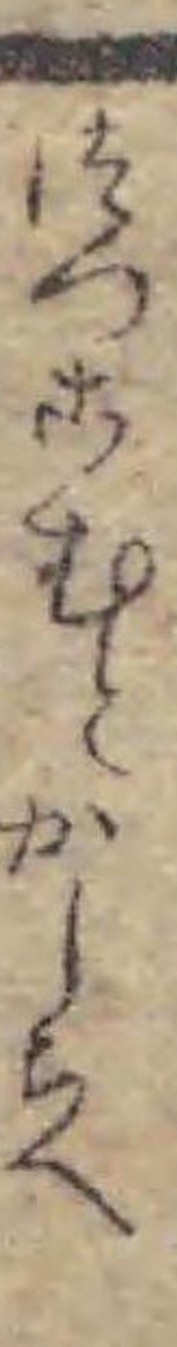つつこむとかしらへ
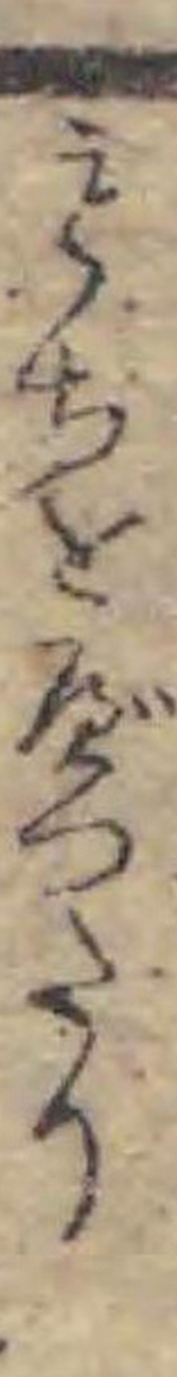もちをべつたり
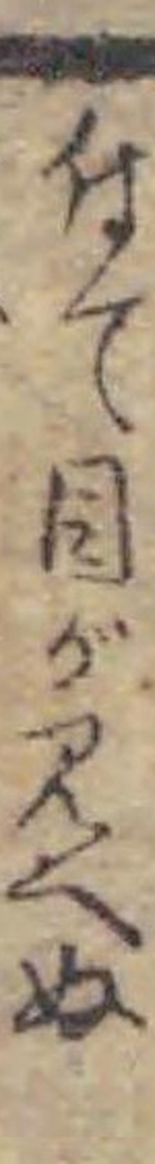付て目がみへぬ
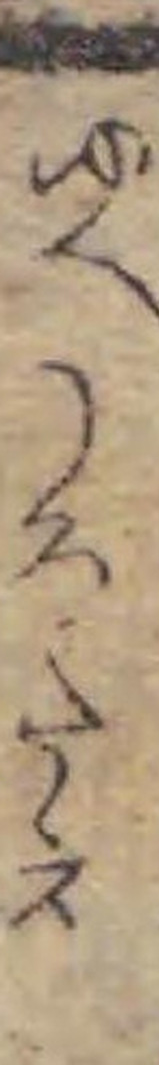ゆへうろたえ
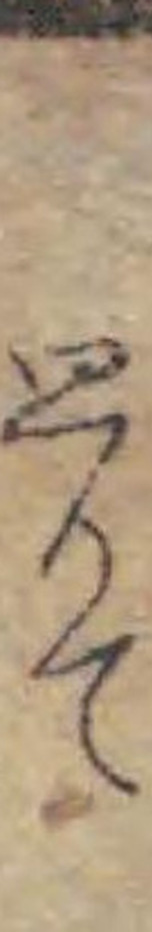廻りて
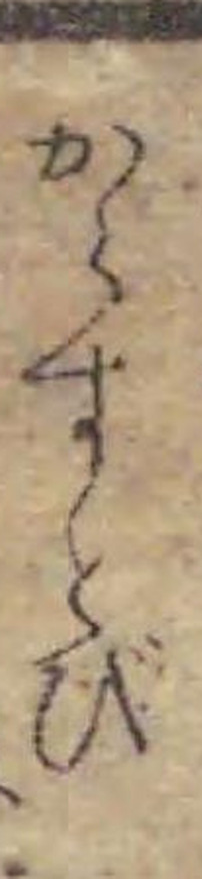からすとび
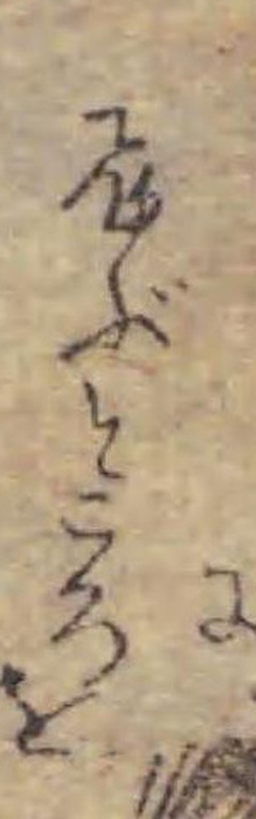飛ぶところを
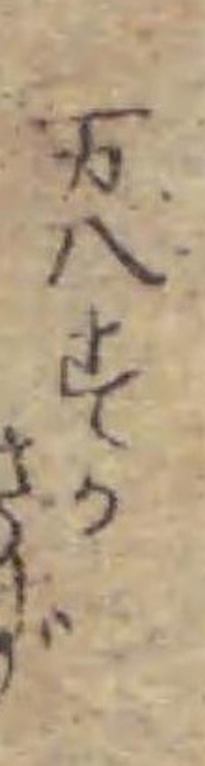万八すか
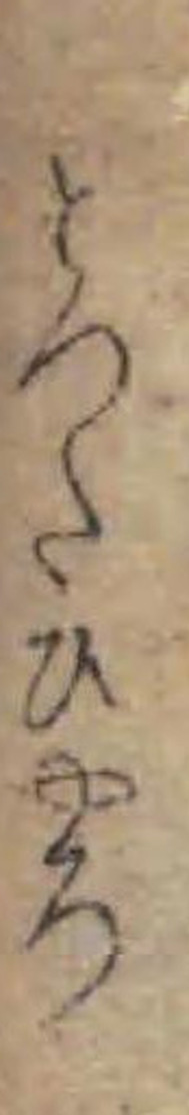とつたひやろ
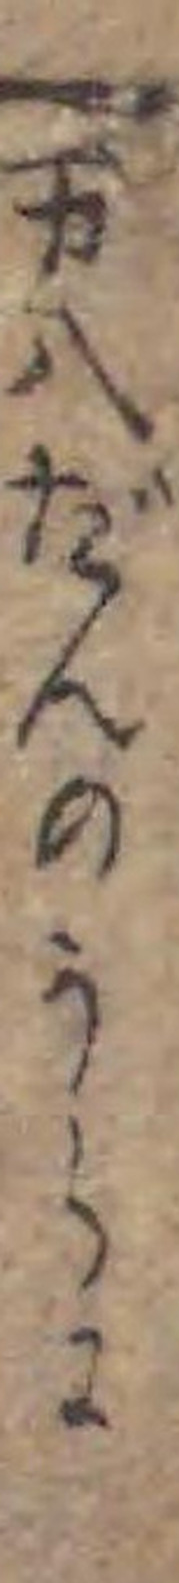万八だんのうらに
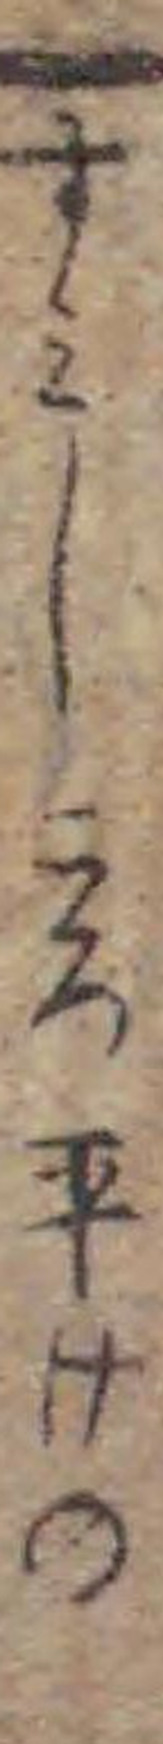すみしころ平けの
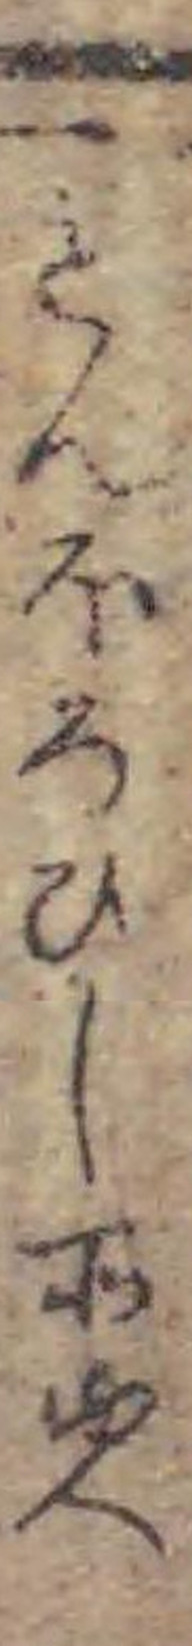一もんほろひし所ゆへ
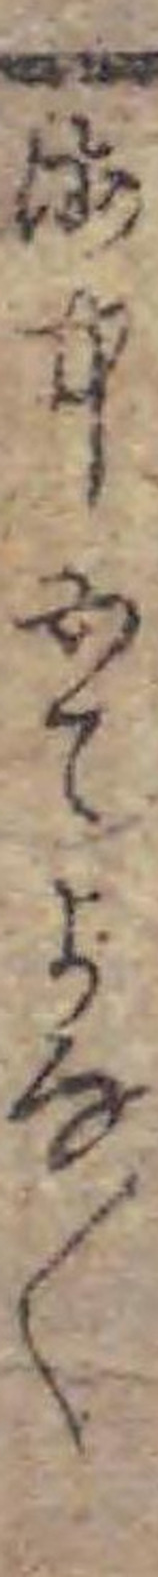海中にてよな〳〵
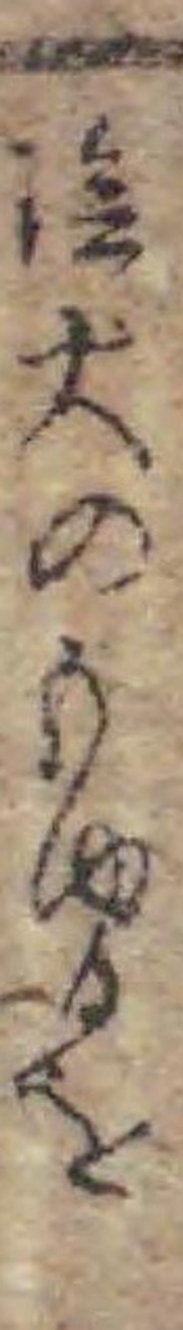陰火のもゆるを
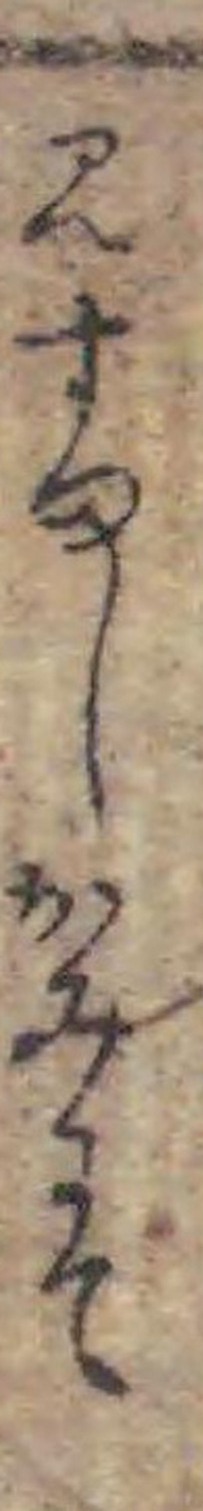見すましかみにて
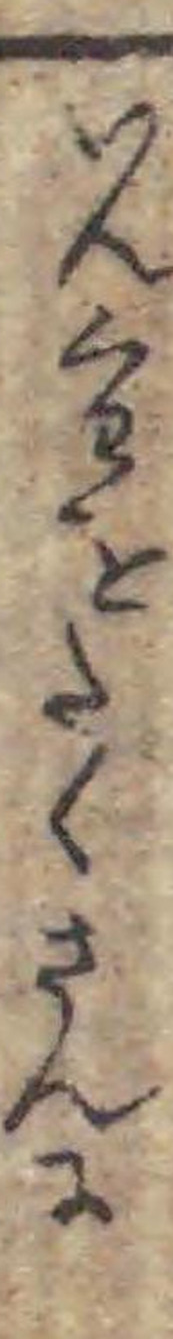いんくわをたくさんに
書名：虚言八百万八伝 : 3巻
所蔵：国立国会図書館 National Diet Library, JAPAN
